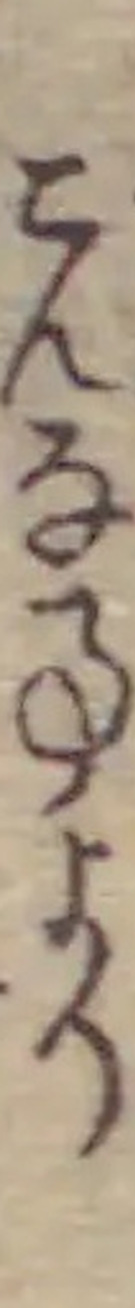こんな事より
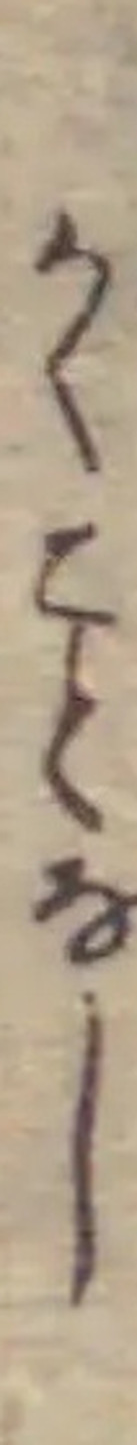かくことなし

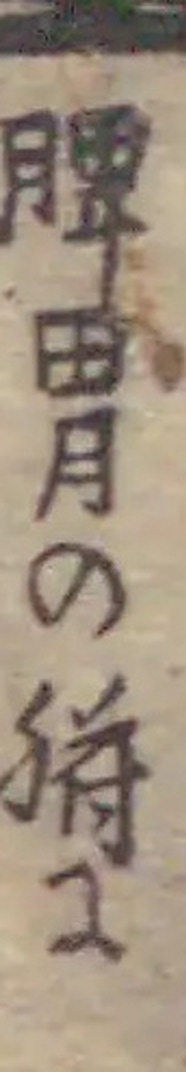脾胃の腑に
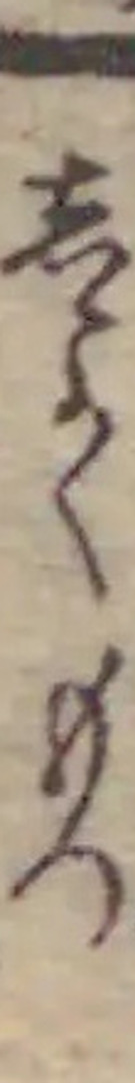しよくもつ
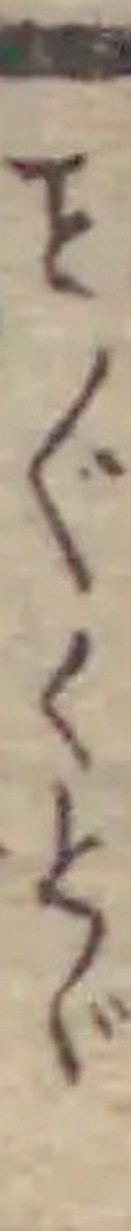こと〴〵くとゞ
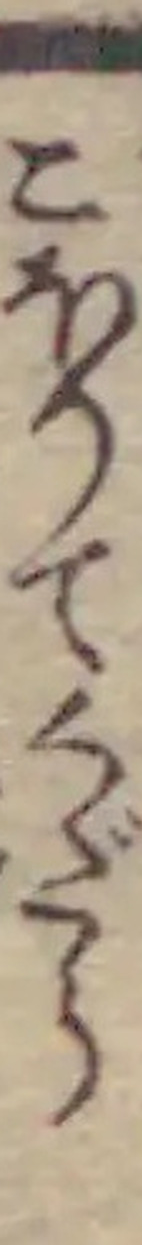こほりてくだら
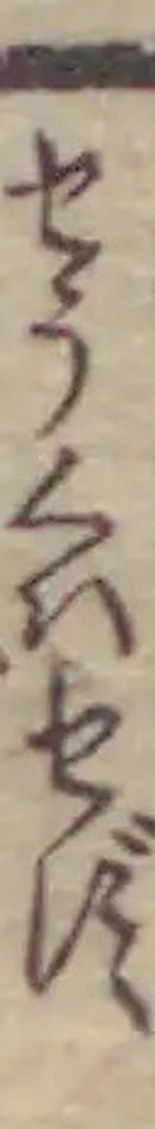せうくはせず
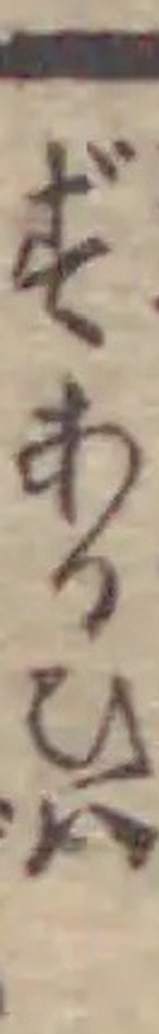ずあるひは
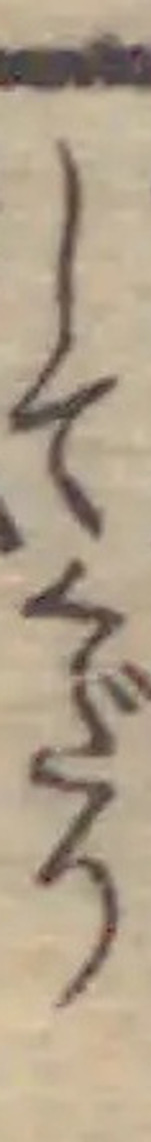してくだり
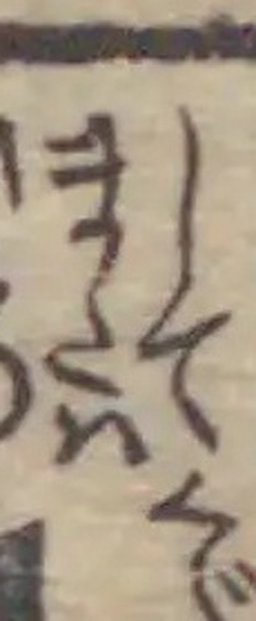または
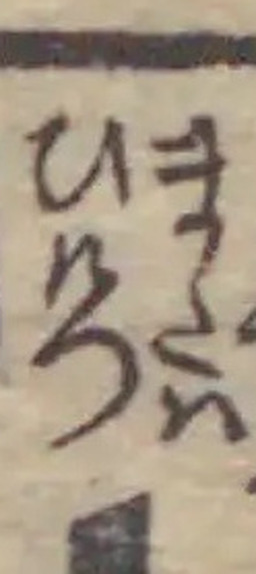ひけつ
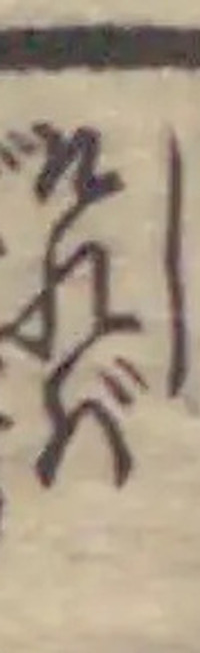ければ
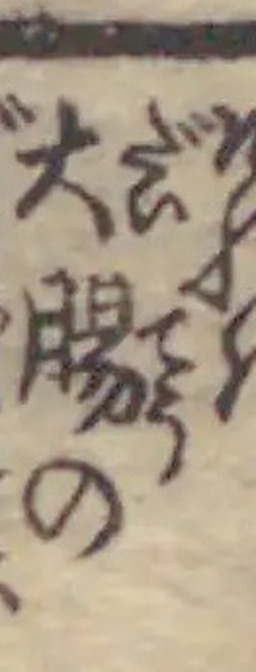大腸の
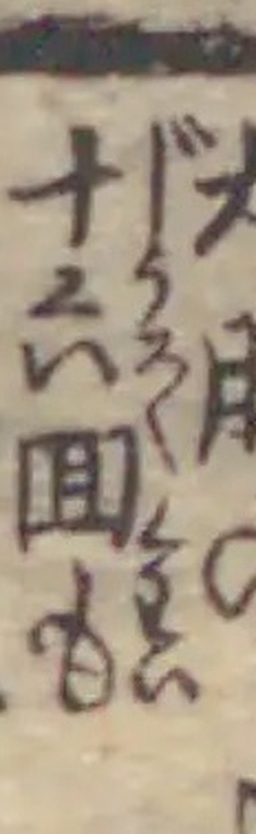十六回も
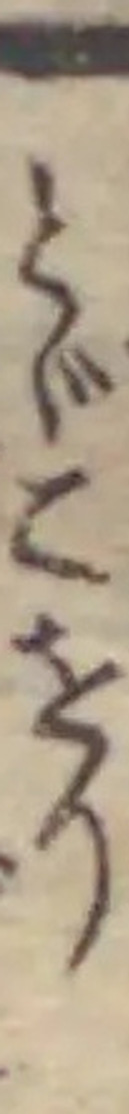とゞこをり
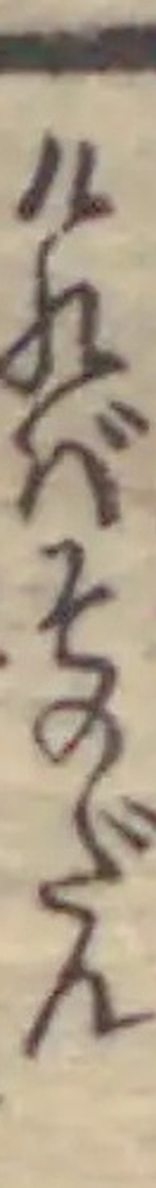ければそのだん
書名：腹内養生主論 3巻
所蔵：国立国会図書館 National Diet Library, JAPAN
